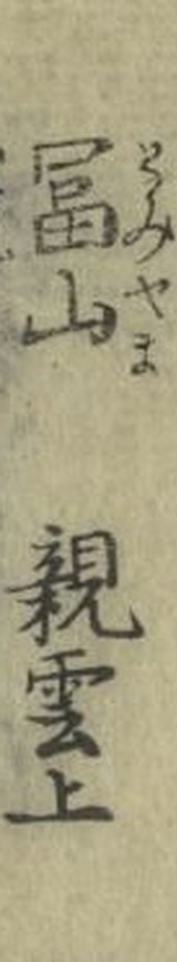冨山親雲上
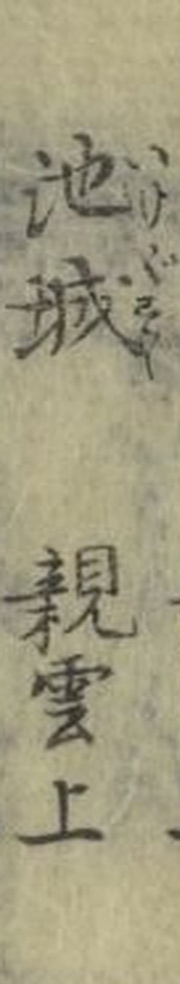池城親雲上
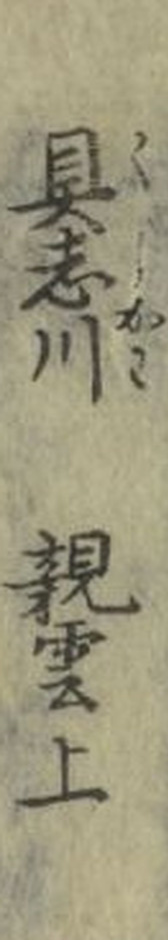具志川親雲上
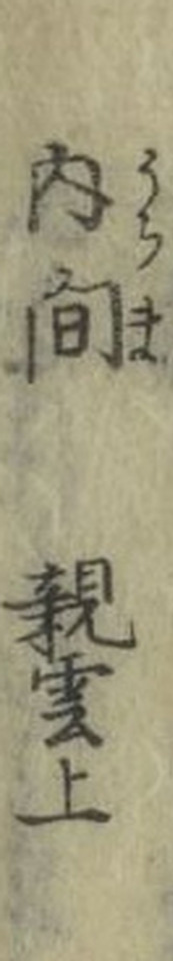内間親雲上
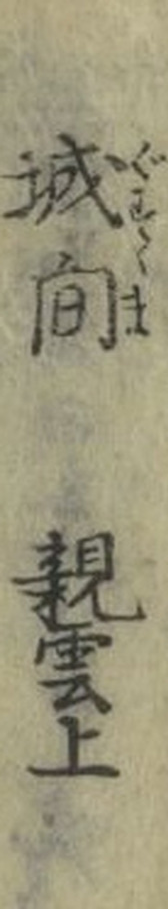城間親雲上
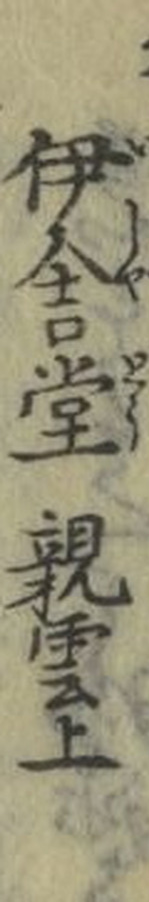伊舎堂親雲上
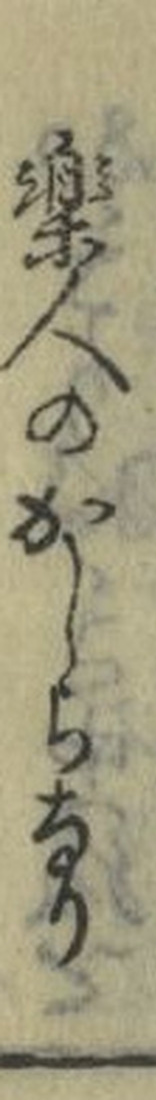樂人のかしらなり
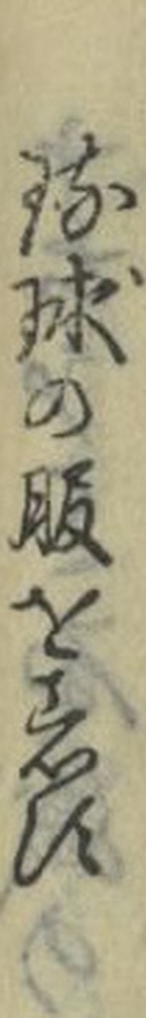琉球の服を着す
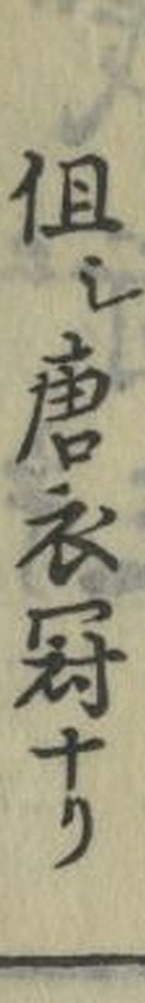但唐衣冠ナリ
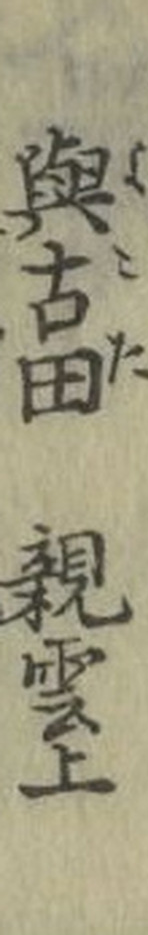與古田親雲上
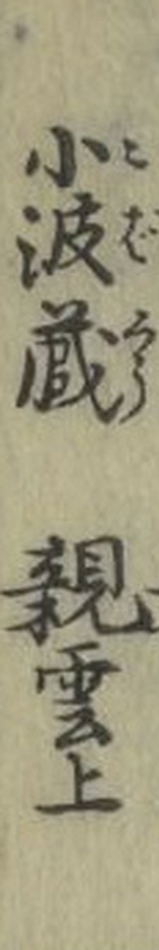小波蔵親雲上

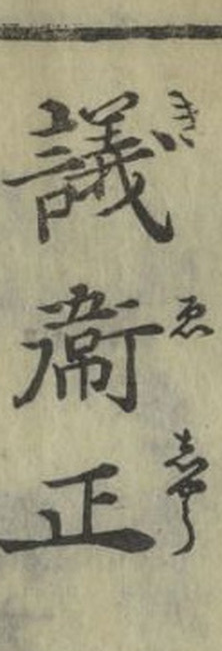議衛正
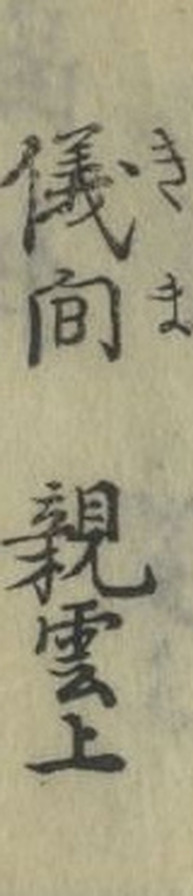儀間親雲上
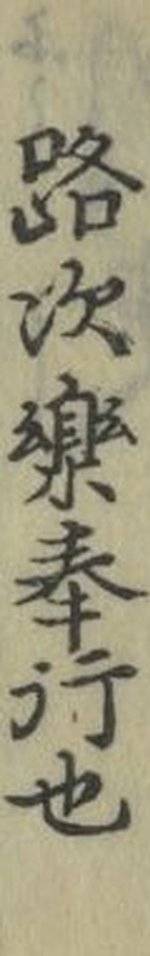路次樂奉行也
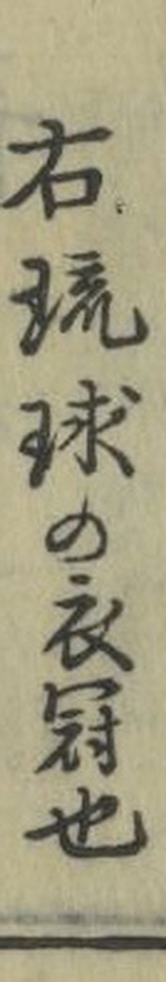古琉球の衣冠也
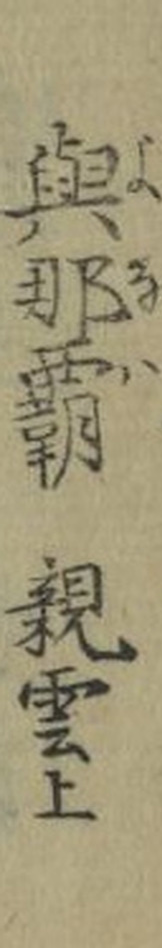與那覇親雲上
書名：[琉球人行列記]
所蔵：University of the Ryukyus Library
